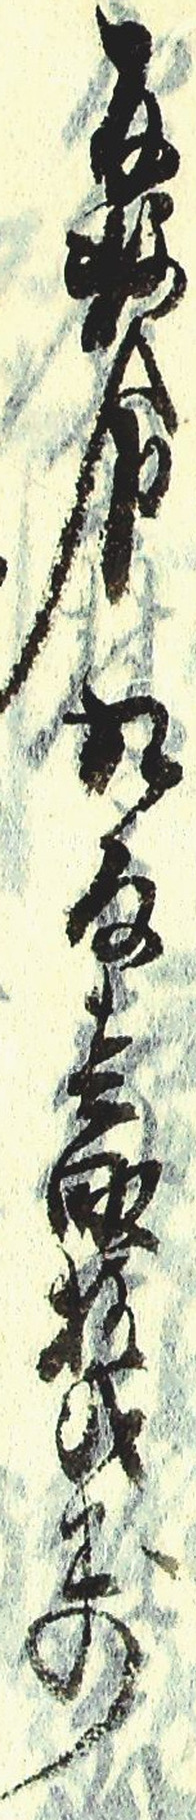反数合九反壱畝拾弍歩
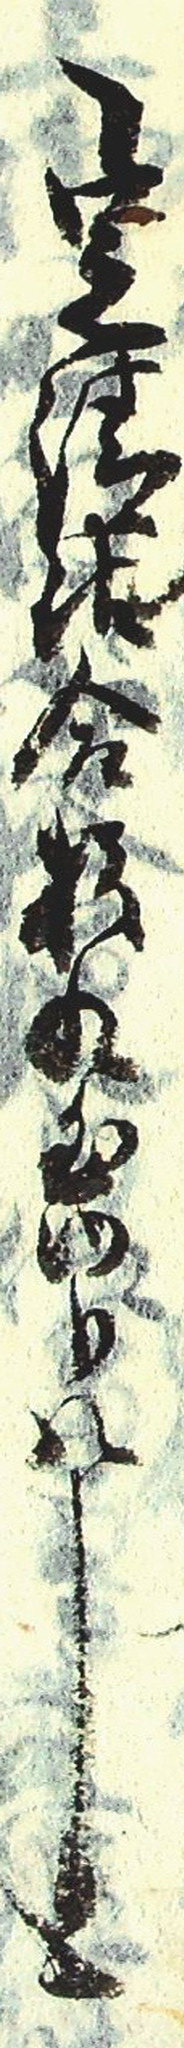定請銀合拾九匁弐分八厘
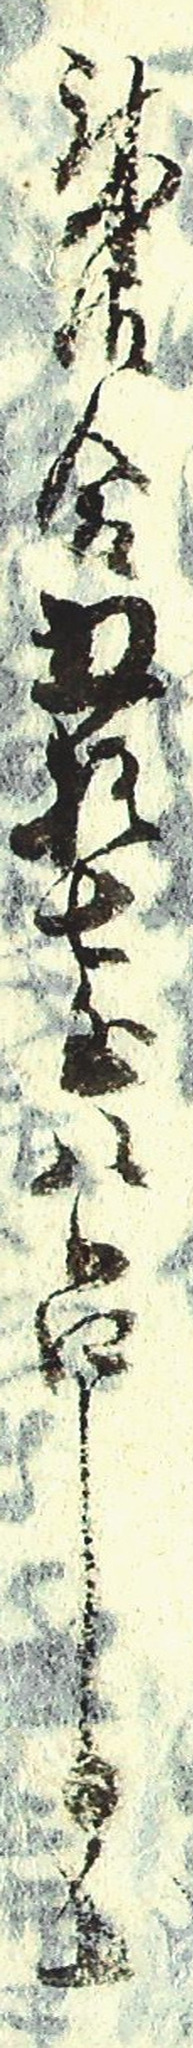床銀合五拾七匁八分四厘
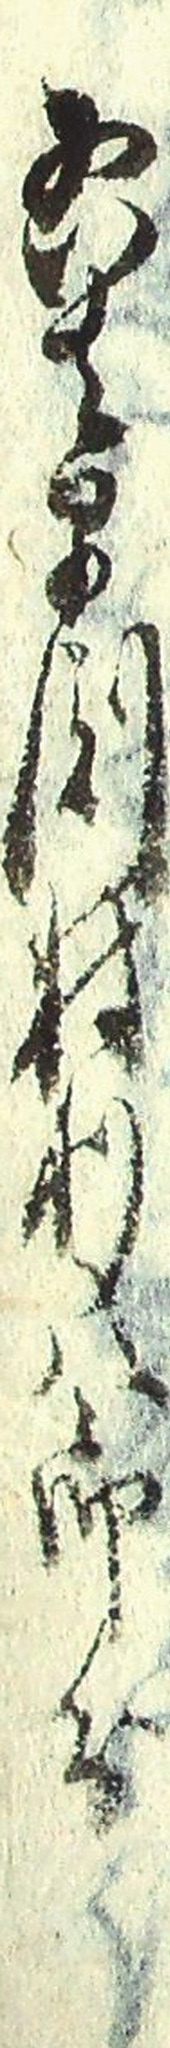右は早淵村利八郎分

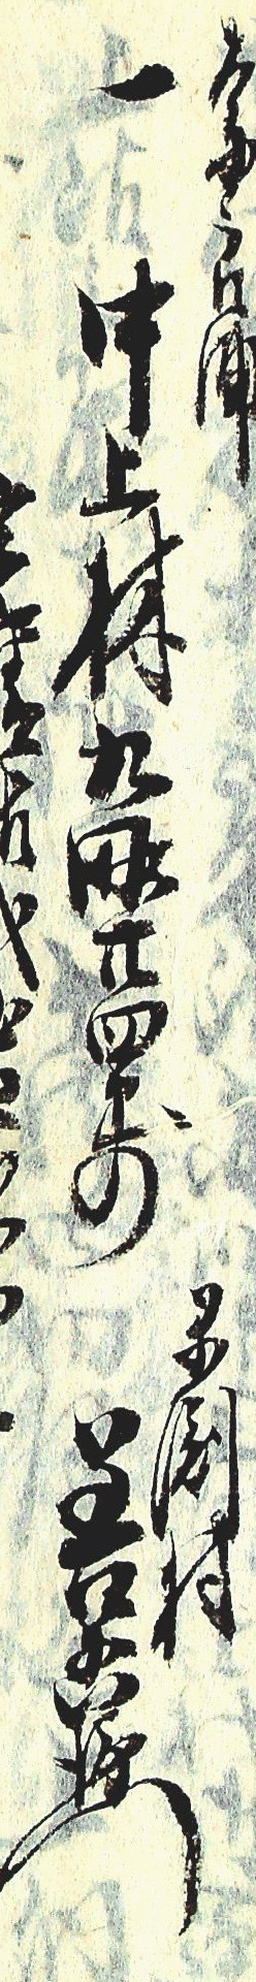一中上林九畝廿四歩善右衛門
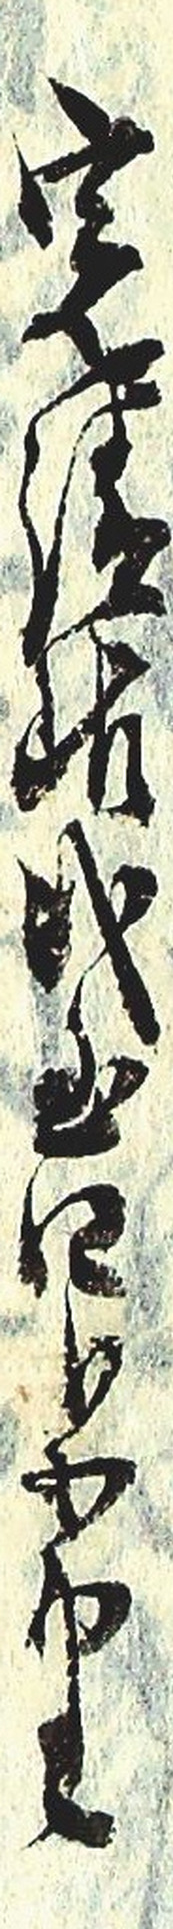定請銀弐匁四分五厘
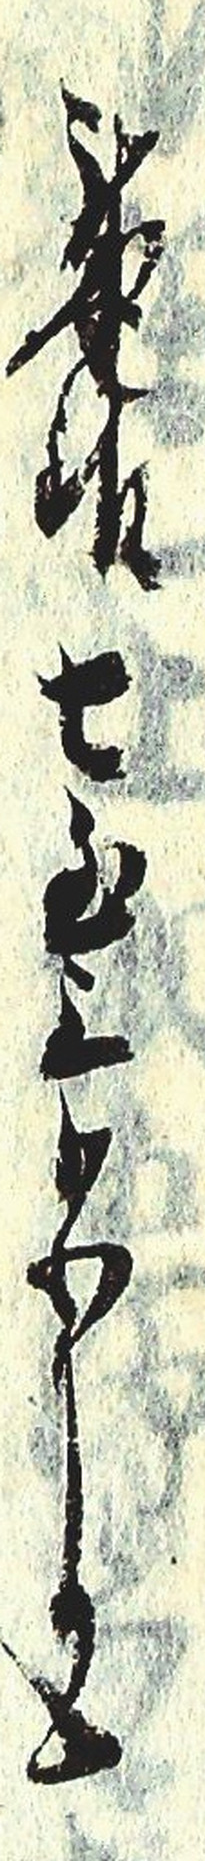床銀七匁三分五厘
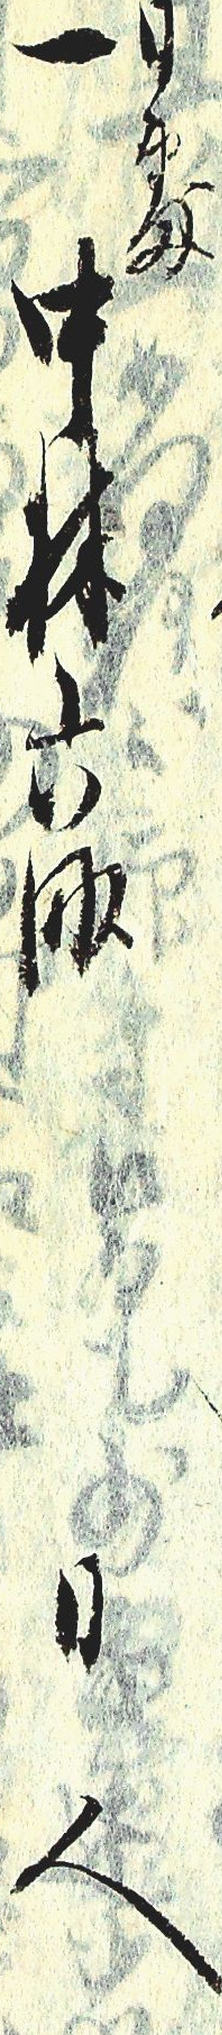一中林六畝同人
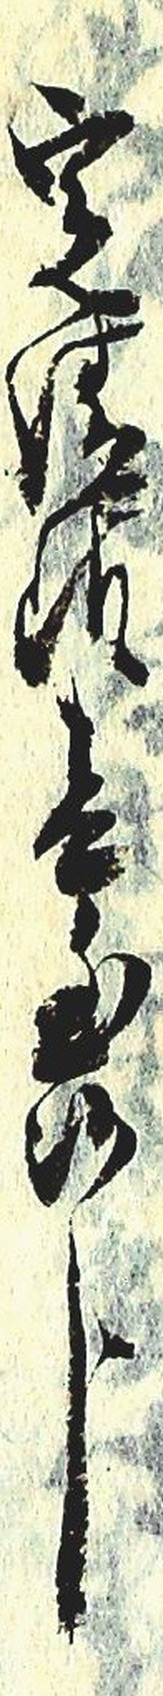定請銀壱匁弐分
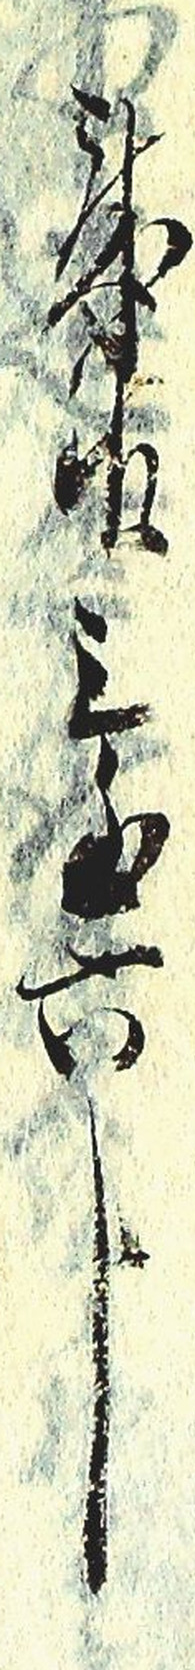床銀三匁六分
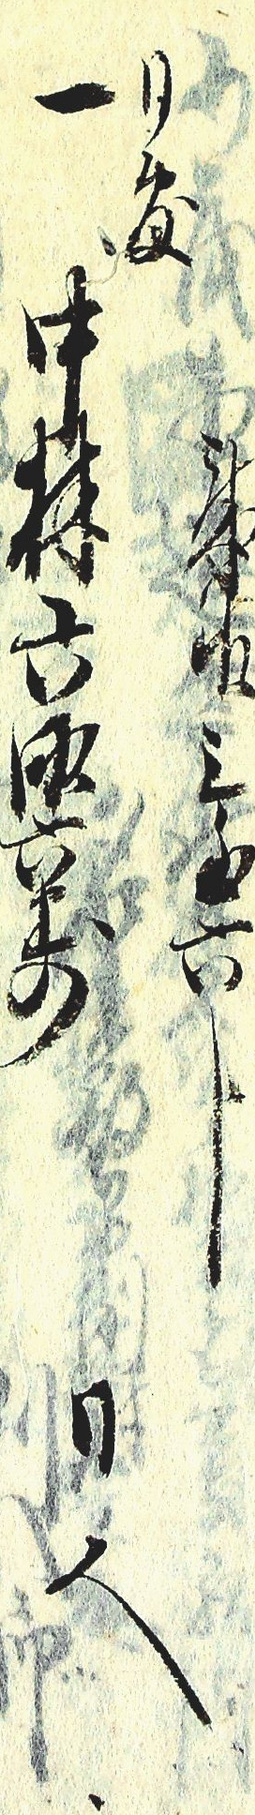一中林六畝六歩同人
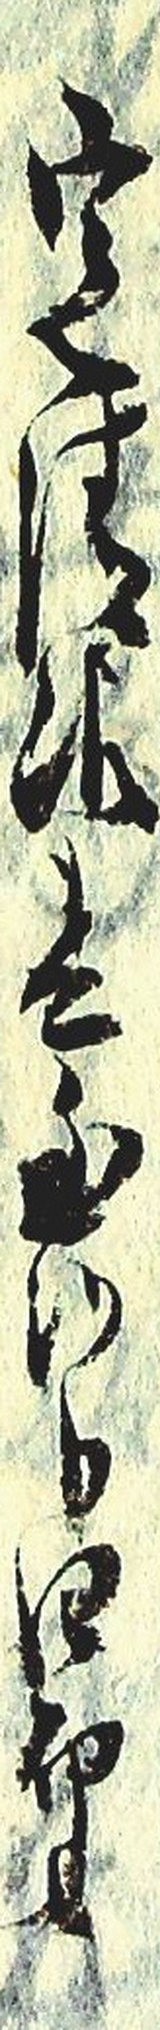定請銀壱匁弐分四厘
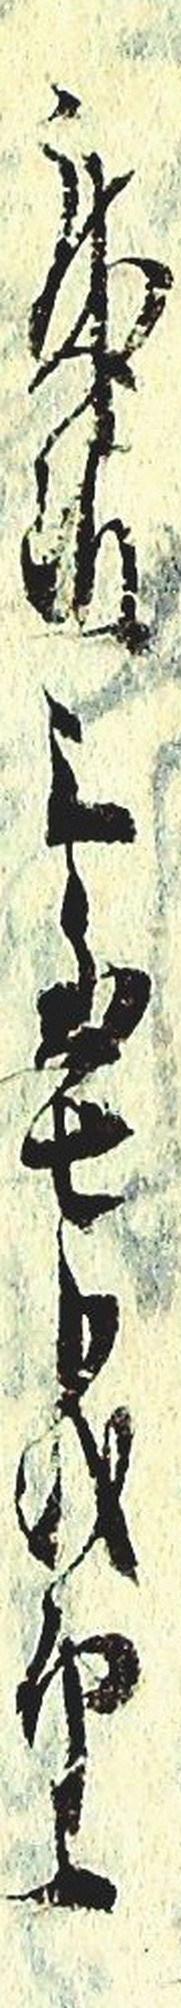床銀三匁七分弐厘
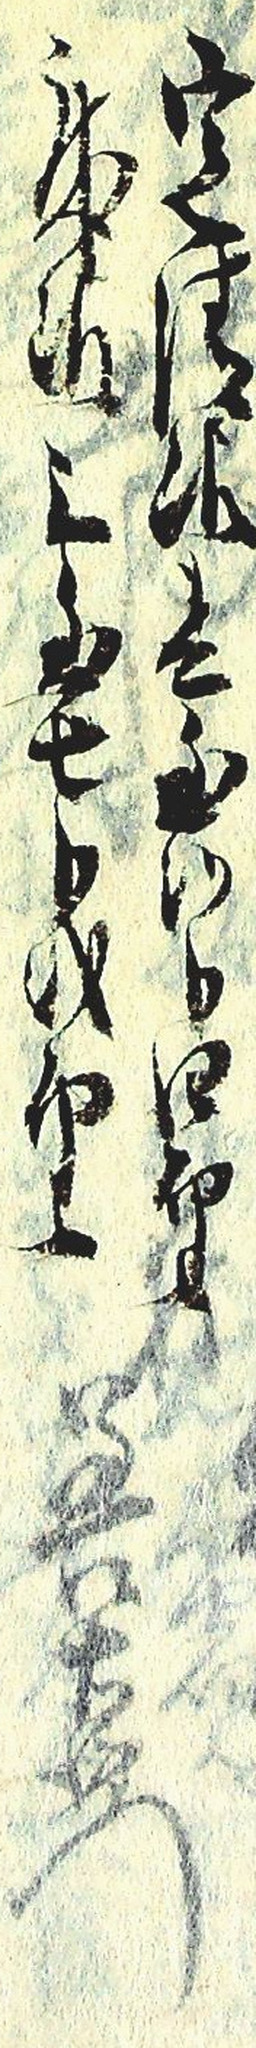床銀三匁七分弐厘
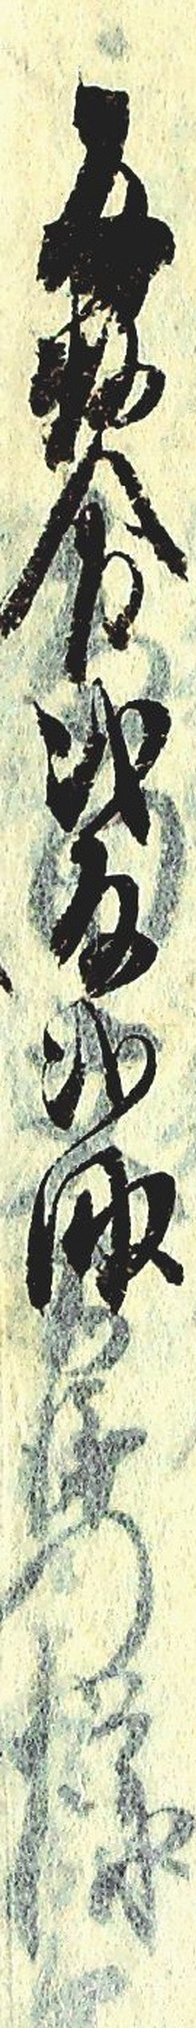反数合弐反弐畝
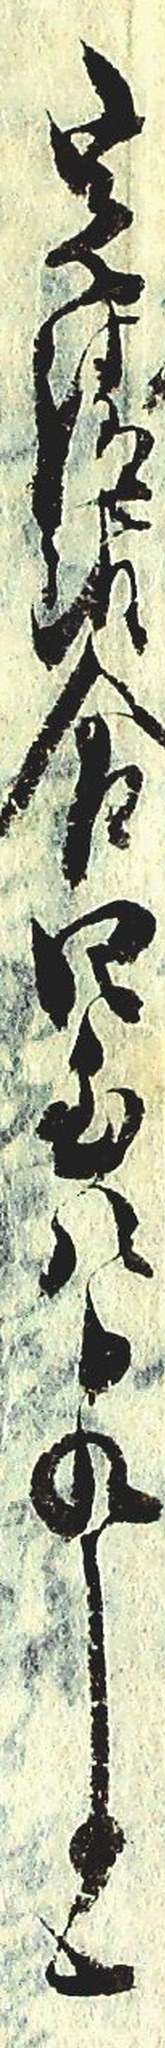定請銀合四匁八分九厘
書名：諸御願書控(弐番）
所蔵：鳴門教育大学 Naruto University of Education
